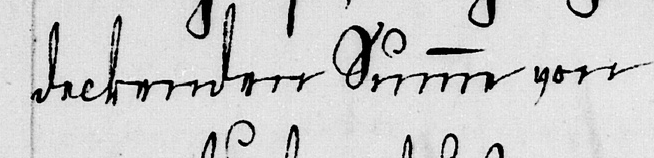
deckenden Summe von
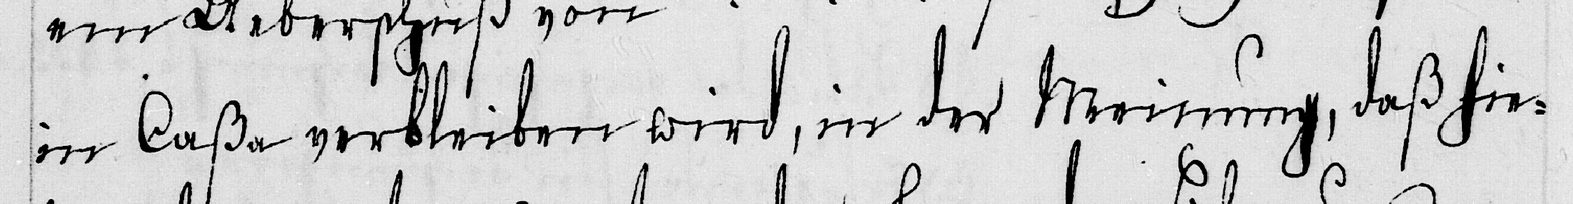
in Caßa verbleiben wird, in der Meinung, daß hie¬
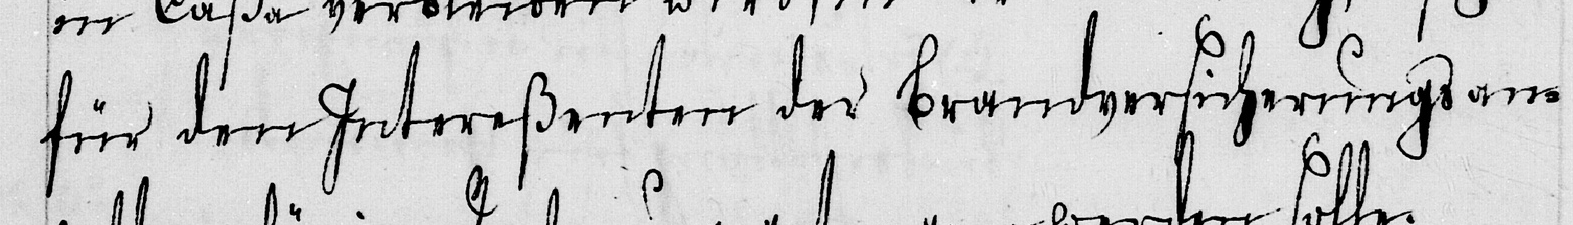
für den Intereßenten der Brandversicherungsan¬
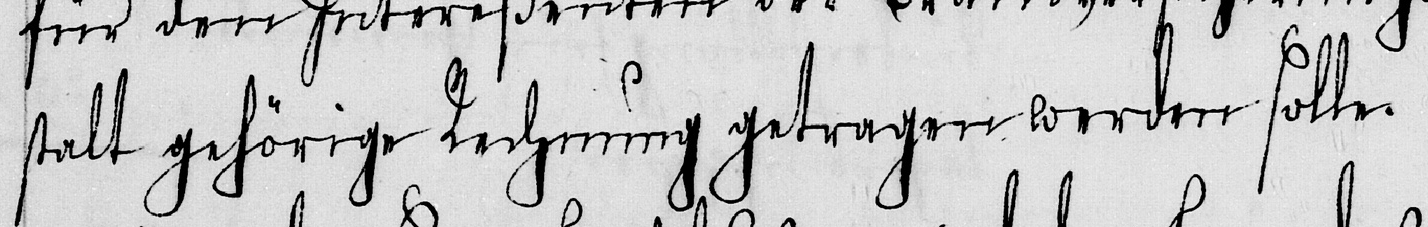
stalt gehörige Rechnung getragen werden solle.
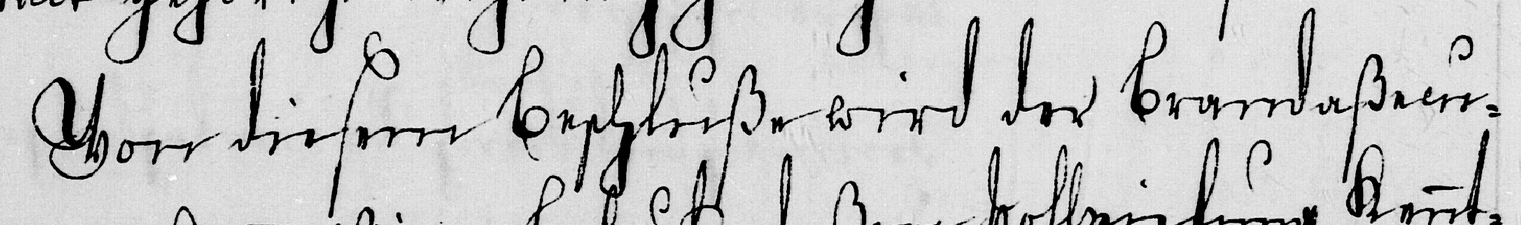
Von diesem Beschluße wird der Brandaßecu¬
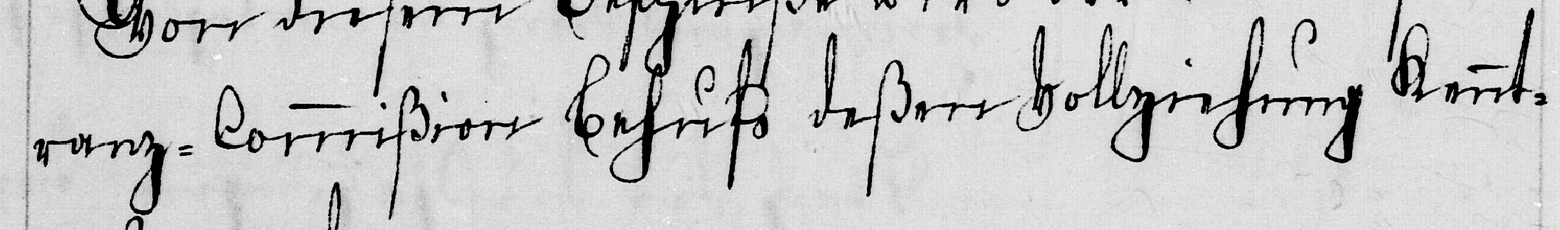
ranz-Commißion Behufs deßen Vollziehung Kennt¬
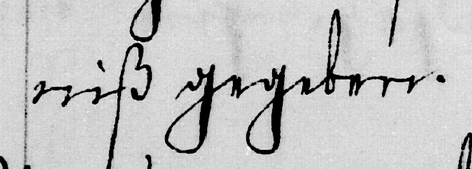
niß gegeben.
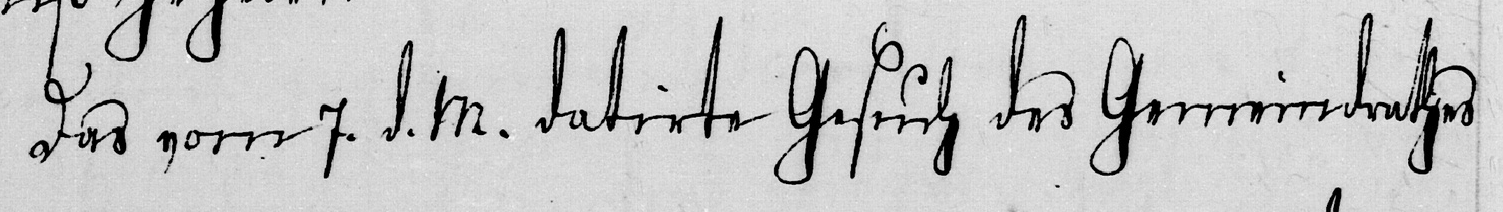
Das vom 7. d. M. datirte Gesuch des Gemeindrathes
